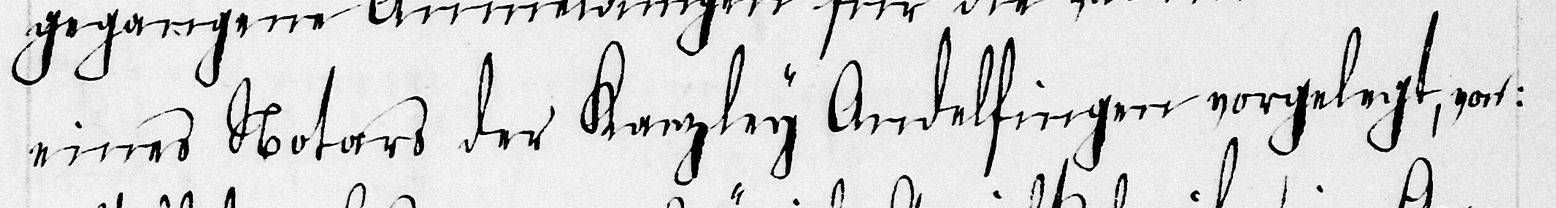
eines Notars der Kanzley Andelfingen vorgelegt, von:
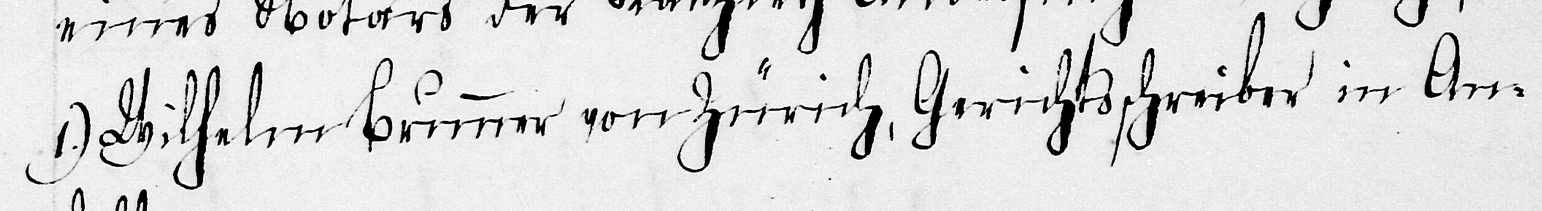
1.) Wilhelm Brunner von Zürich, Gerichtsschreiber in An¬
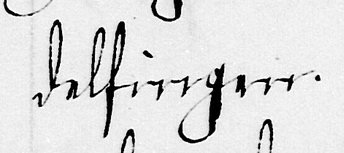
delfingen.
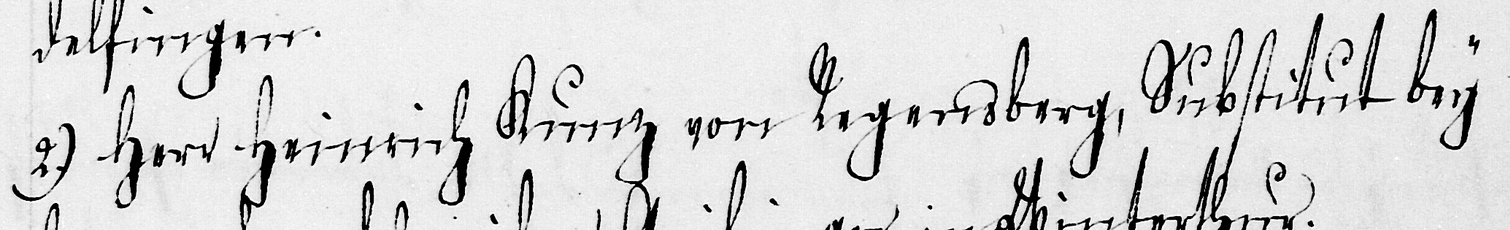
2.) Herr Heinrich Kunz von Regensberg, Substitut bey
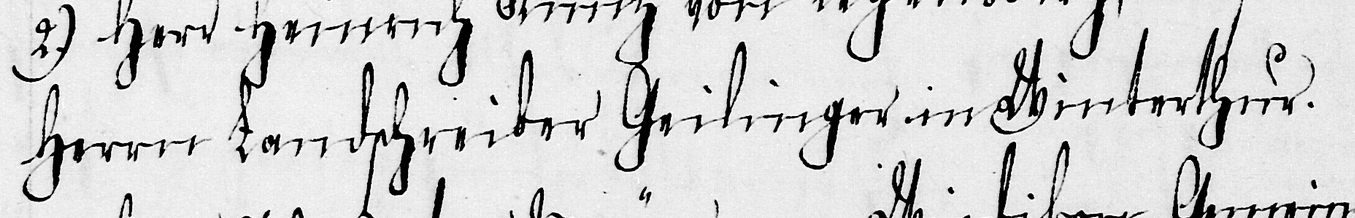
Herrn Landschreiber Geilinger in Winterthur.
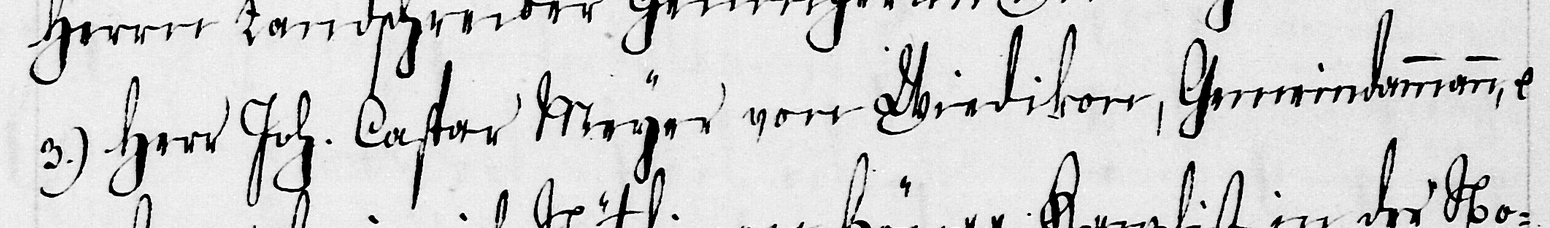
3.) Herr Joh. Caspar Meyer von Wiedikon, Gemeindammann,
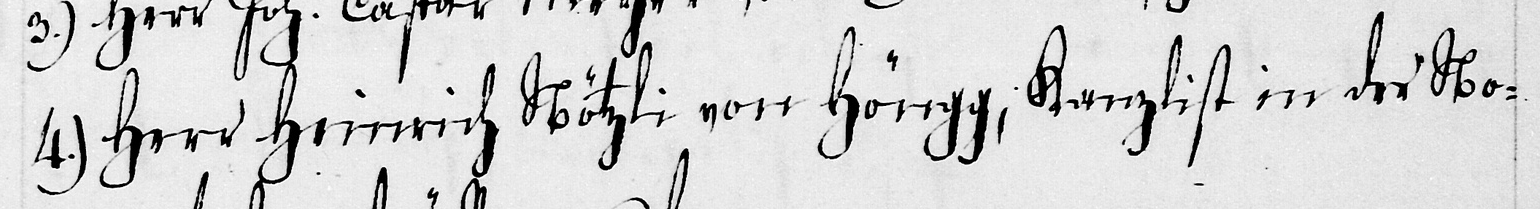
4.) Herr Heinrich Nötzli von Höngg, Kanzlist in der No¬
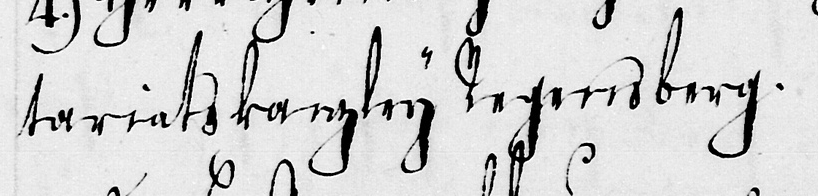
tariatskanzley Regensberg.
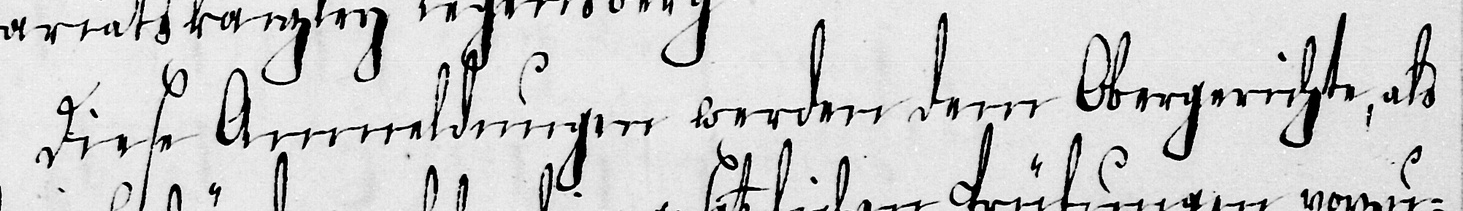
Diese Anmeldungen werden dem Obergerichte, als
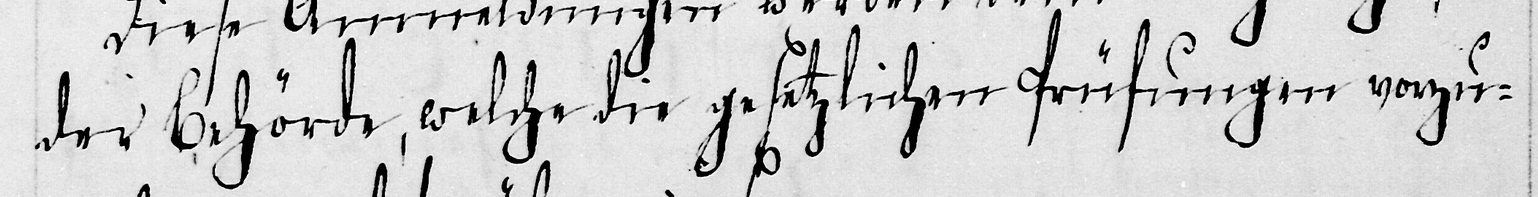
der Behörde, welche die gesetzlichen Prüfungen vorzu¬
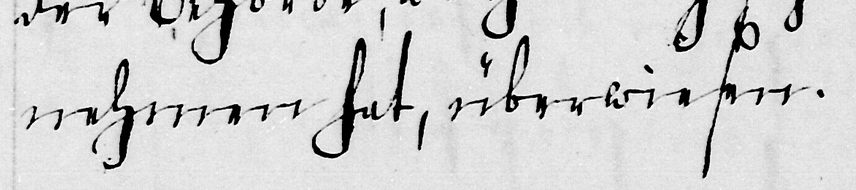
nehmen hat, überwiesen.
